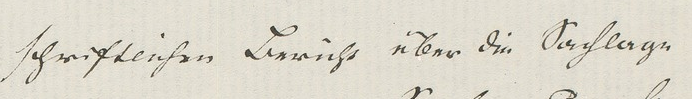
schriftlichen Bericht über die Sachlage
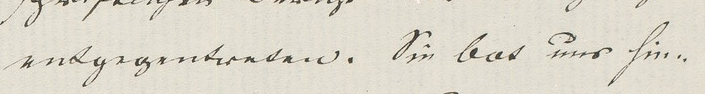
entgegentreten. Sie bot uns hin-
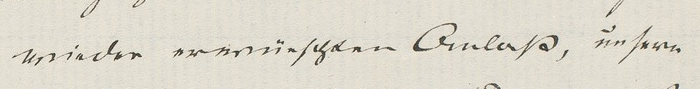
wieder erwünschten Anlaß, unsere
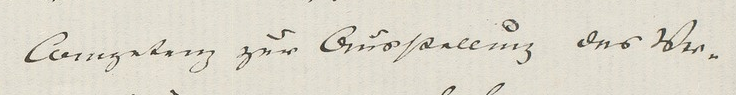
Competenz zur Ausstellung des Ver-
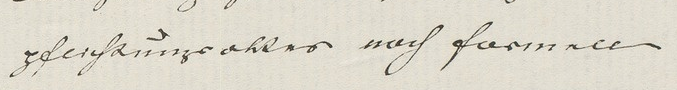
pflichtungsaktes noch formell
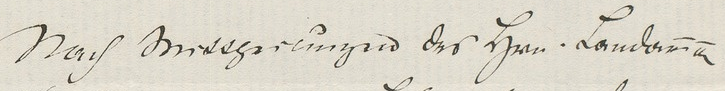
Nach Mittheilungen des Hrn. Landammnn
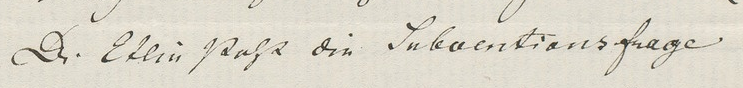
Dr. Etlin steht die Subventionsfrage
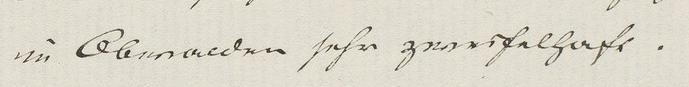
in Obwalden sehr zweifelhaft.
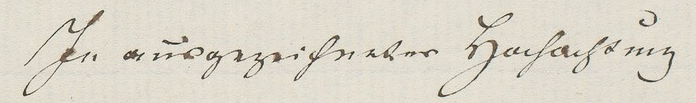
In ausgezeichneter Hochachtung
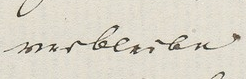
verbleibe
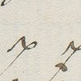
J.
